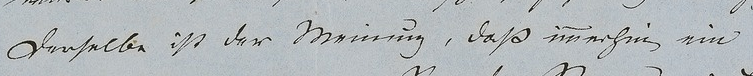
Derselbe ist der Meinung, daß immerhin ein
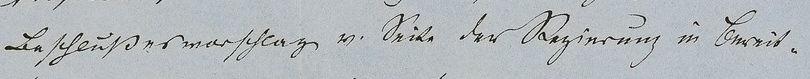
Beschlußesvorschlag v. Seite der Regierung in Bereit-
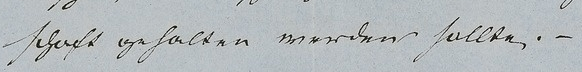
schaft gehalten werden sollte. –
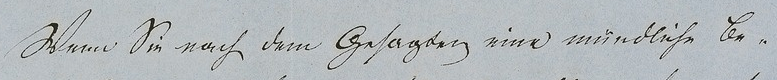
Wenn sie nach dem Gesagten eine mündliche Be-
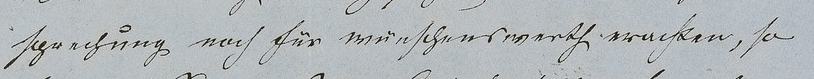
sprechung noch für wünschenswerth erachten, so
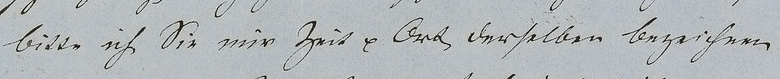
bitte ich Sie mir Zeit & Ort derselben bezeichnen
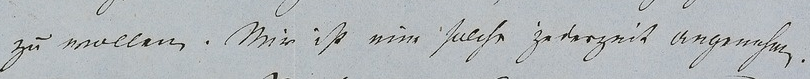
zu wollen. Mir ist eine solche jederzeit angenehm.
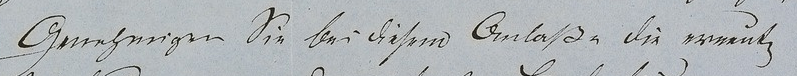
Genehmigen Sie bei diesem Anlaße die erneute
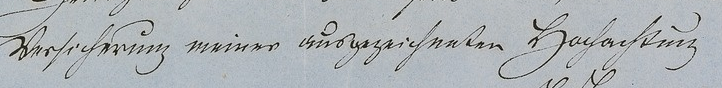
Versicherung meiner ausgezeichneten Hochachtung
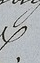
J.
